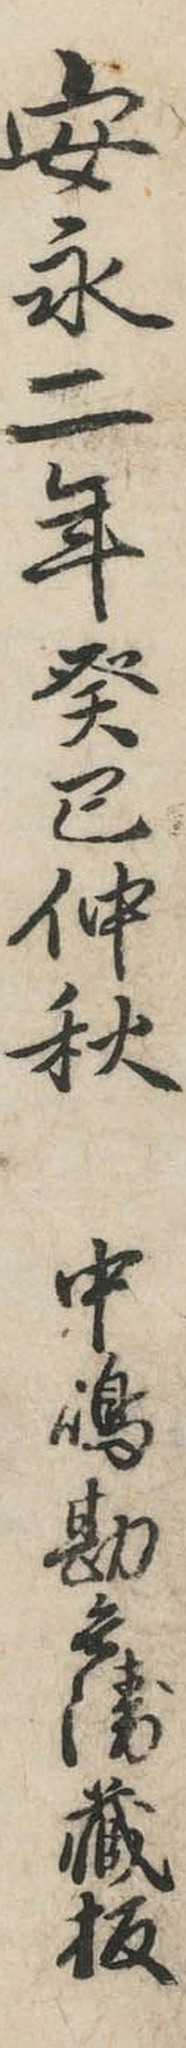安永二年癸巳仲秋中嶋勘兵衛蔵板
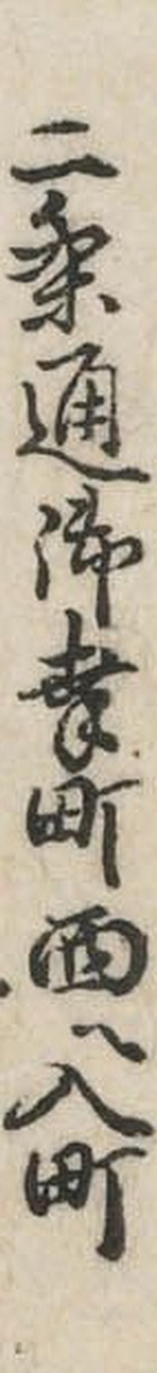二条通御幸町西へ入町
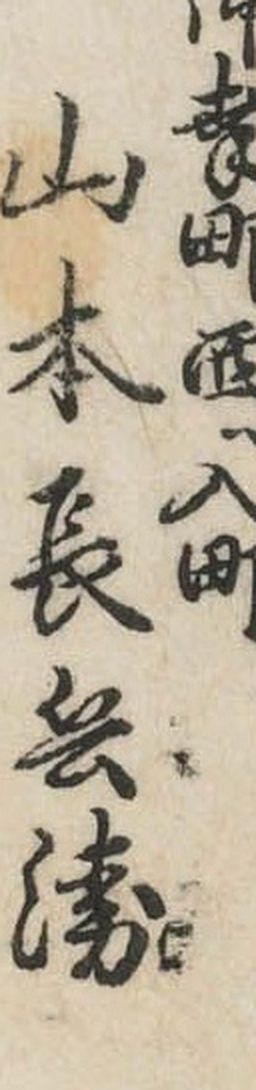山本長兵衛
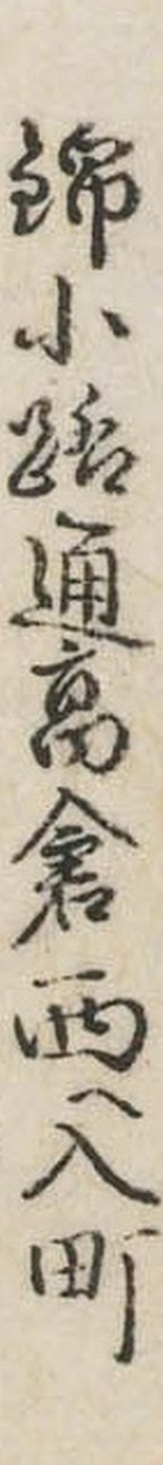錦小路通高倉西へ入町
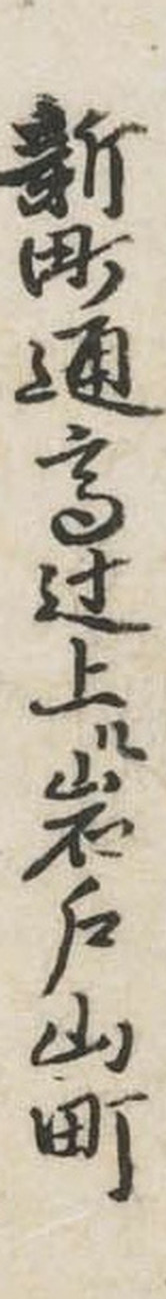新町通高辻上る岩戸山町
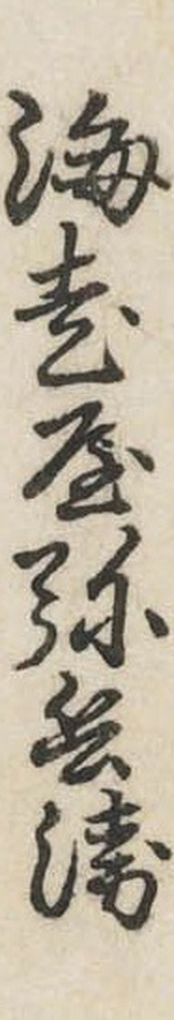海老屋弥兵衛
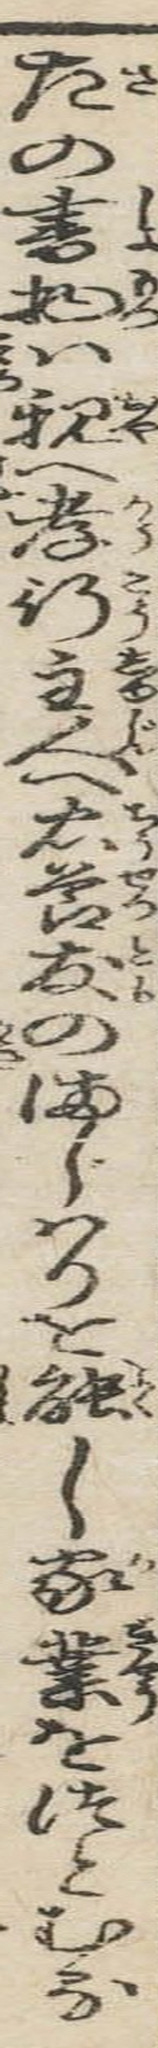左の書物は親へ孝行主人へ忠節友のまじはりを能し家業をつとむる
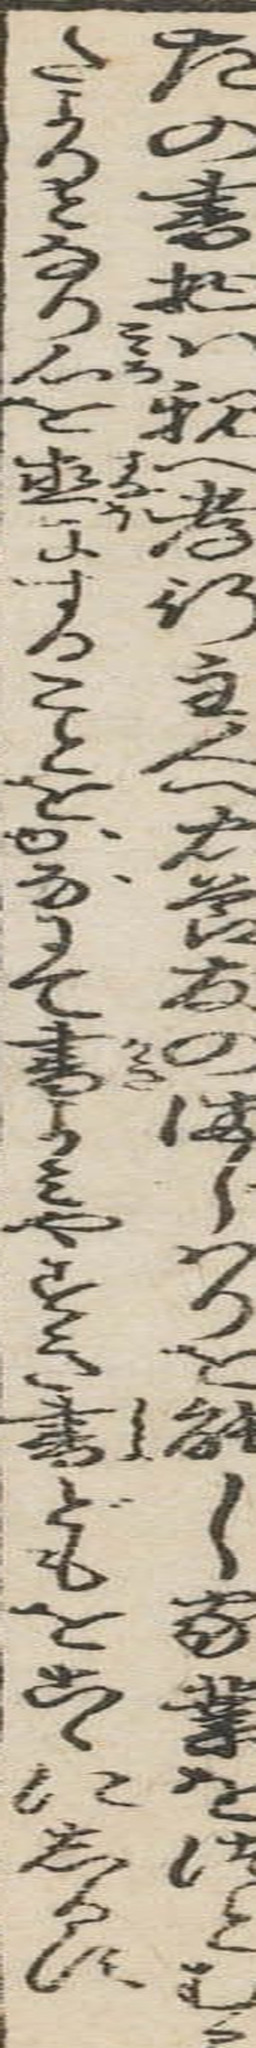たよりとなり心を直にすることをかなにて書よみやすき書どもをこゝにしるす
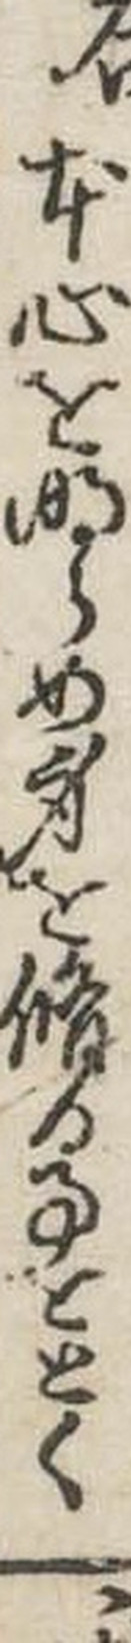本心を明らめ身を脩る事をとく
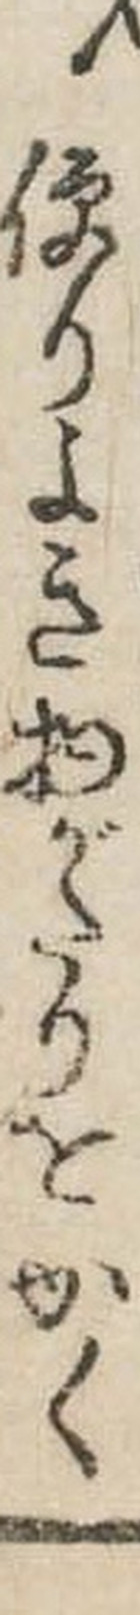便りよき物がたりをかく
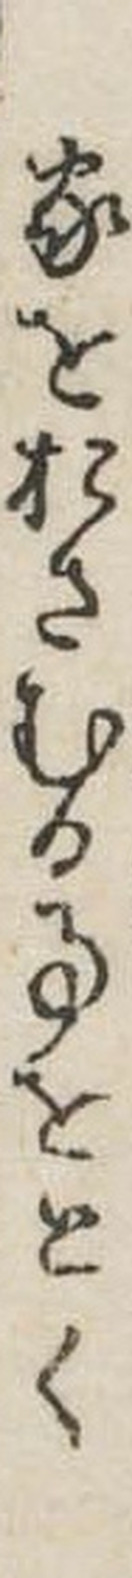家をおさむる事をとく
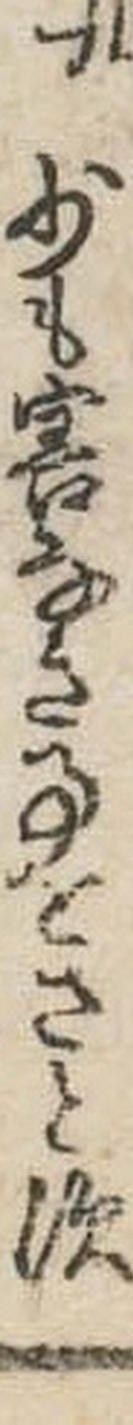少も害なき事をさとす
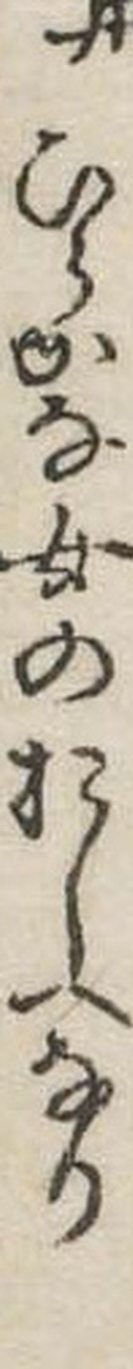ひらかな女のおしへなり
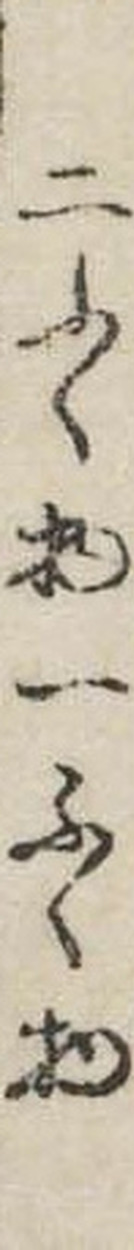二ふく物一ふく物
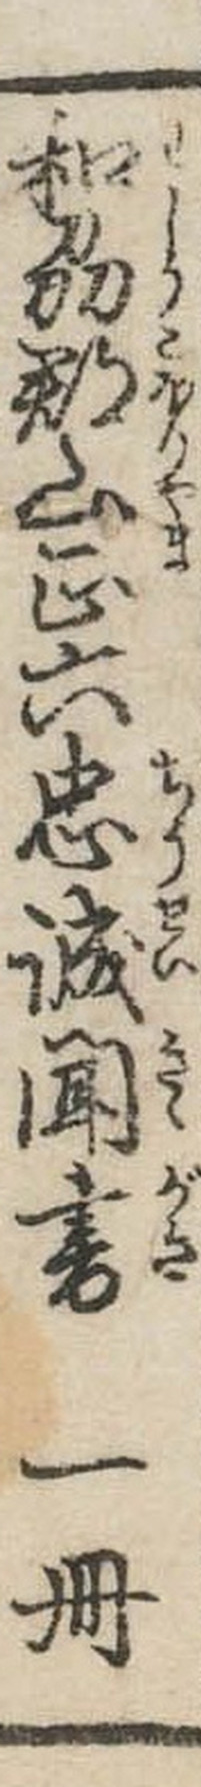和州郡山正六忠誠聞書一冊
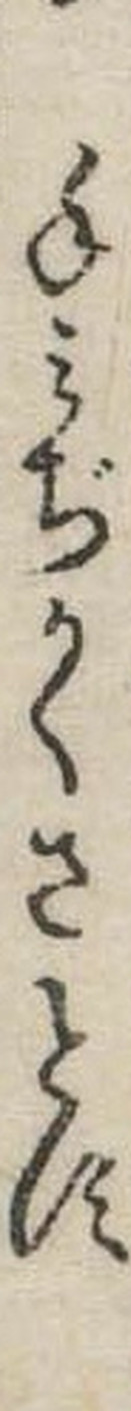てみぢかくさとす
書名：前訓
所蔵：東京学芸大学附属図書館
